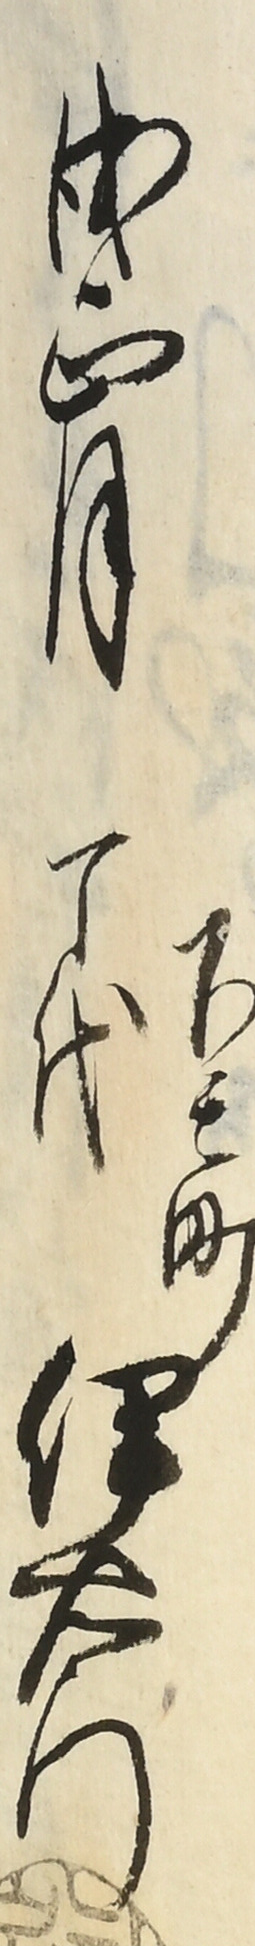戌正月同断忠右衛門

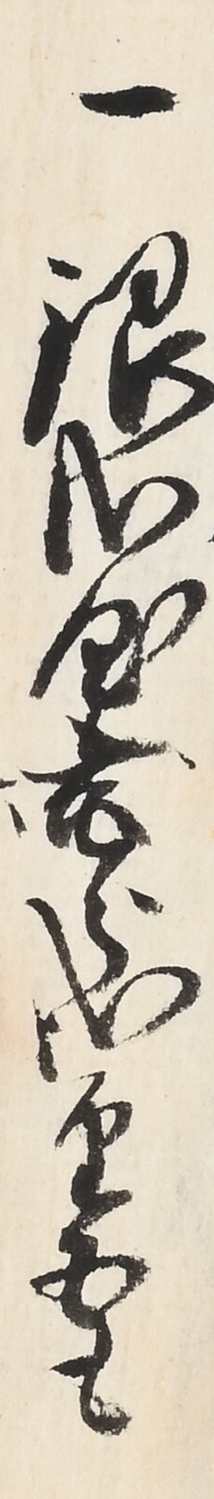一銀弐匁五分弐厘五毛
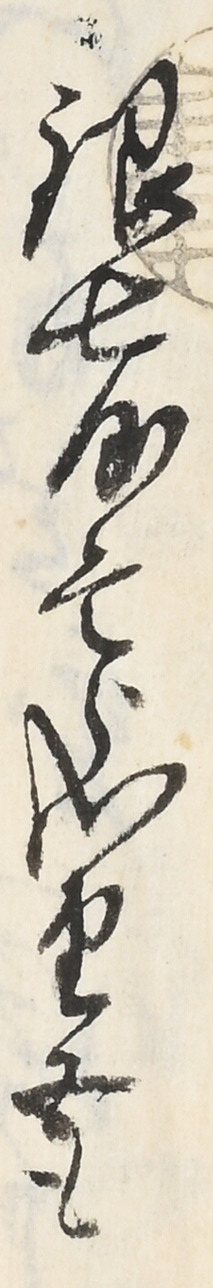銀五匁五分弐厘五毛
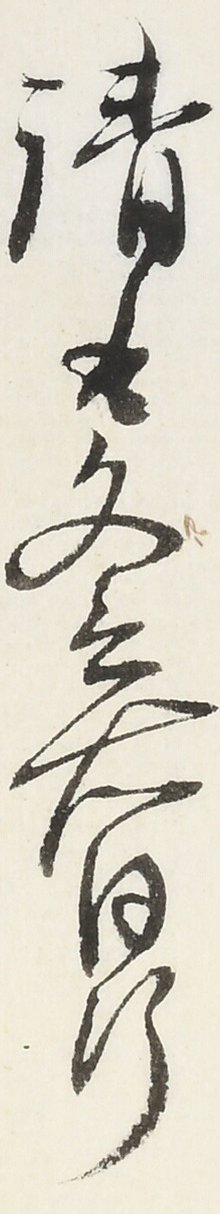請取文言右同断
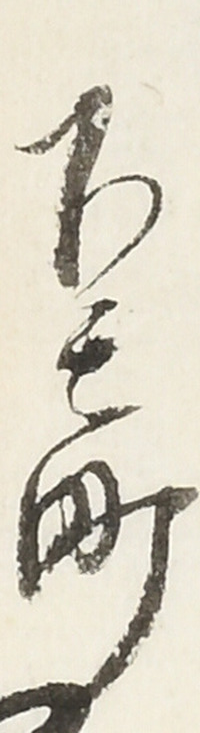下モ町
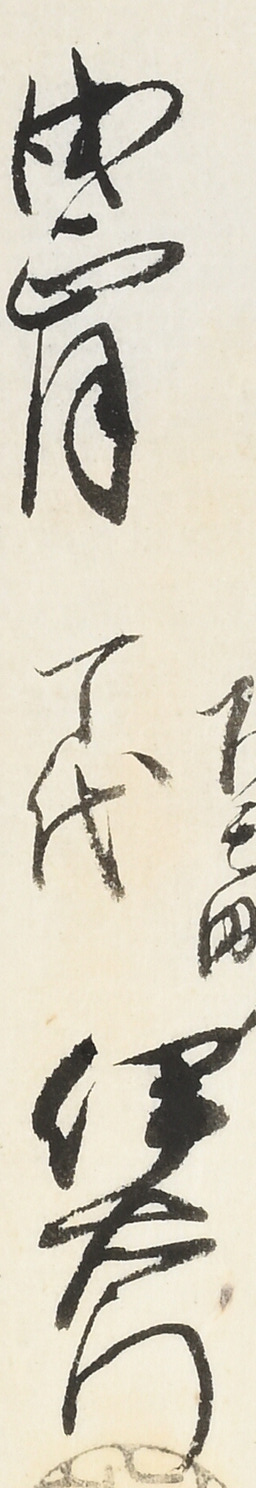戌正月丁代八百右衛門
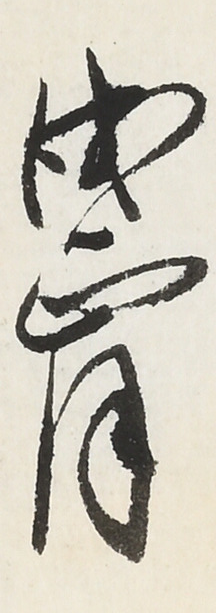戌正月
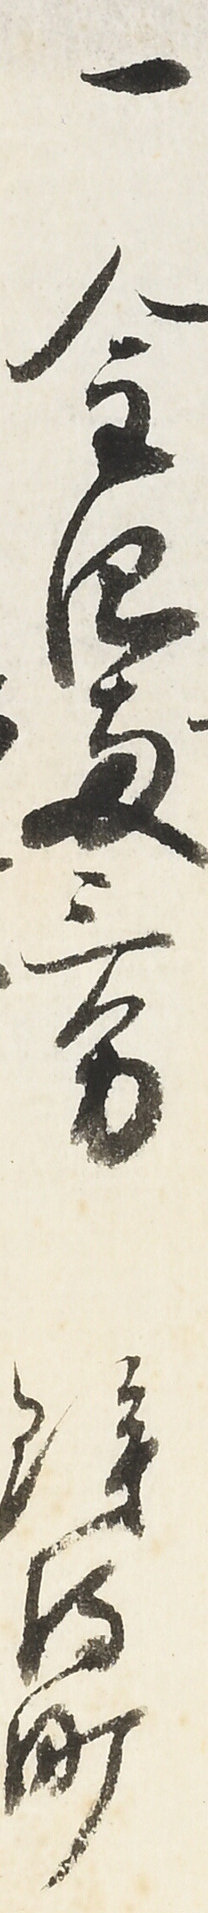一金四両三分鉾持町
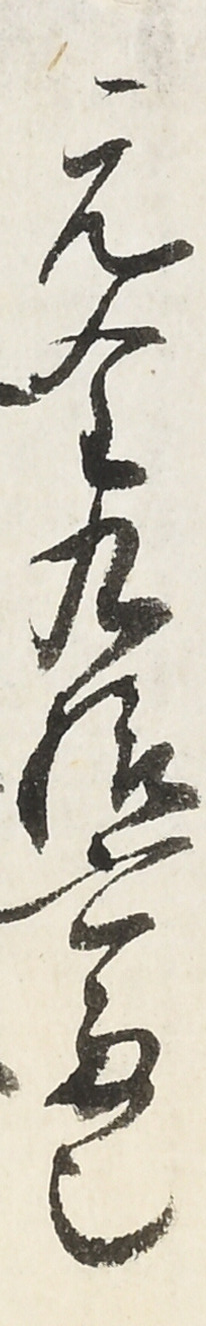元金九拾六両也
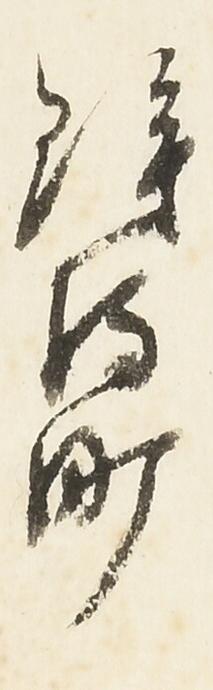鉾持町
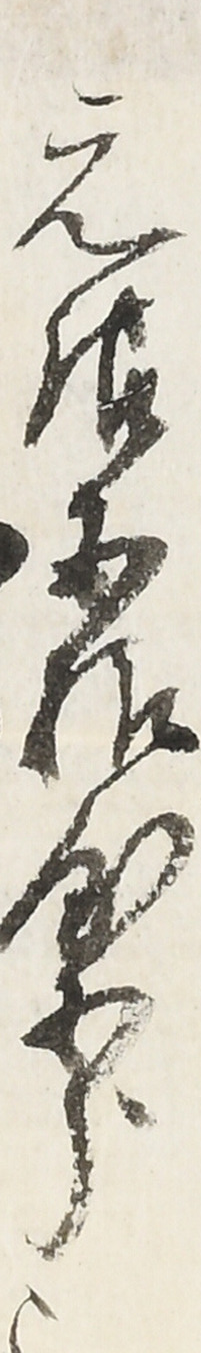元銀五拾匁五分也
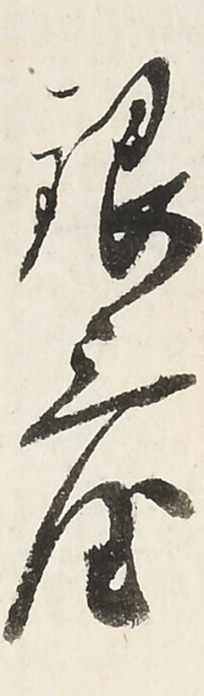銀三匁
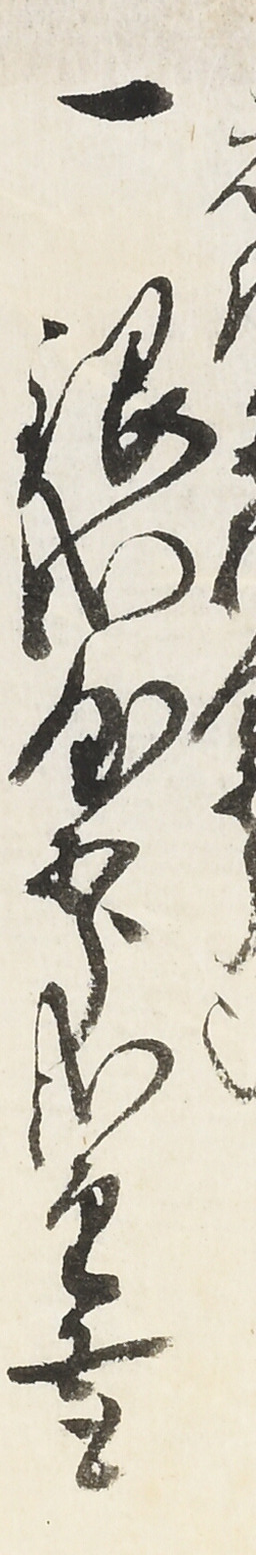一銀弐匁五分弐厘五毛
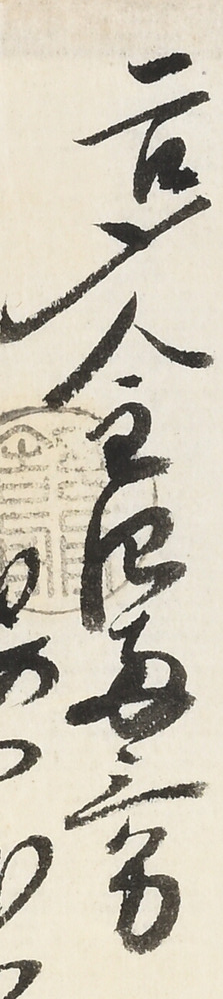二口〆金四両三分
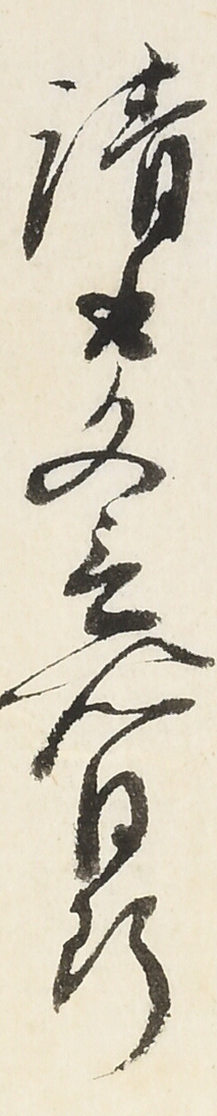請取文言右同断
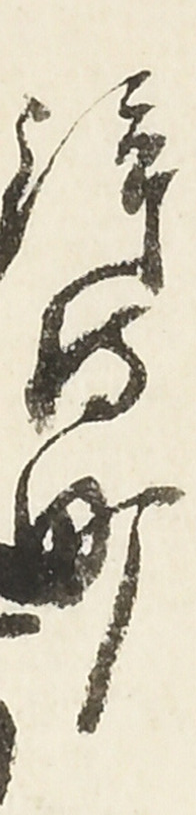鉾持町
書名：御才覚金御利足割渡扣帳
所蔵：伊那市立高遠町図書館・合同会社AMANE
